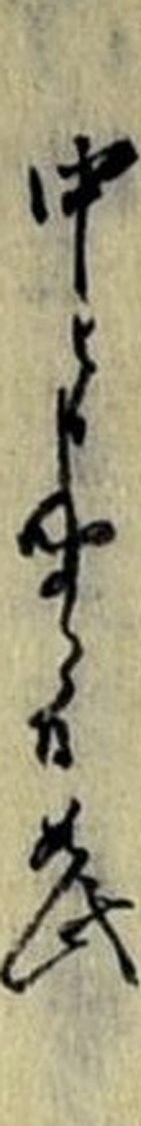中被申聞候ニ付如此
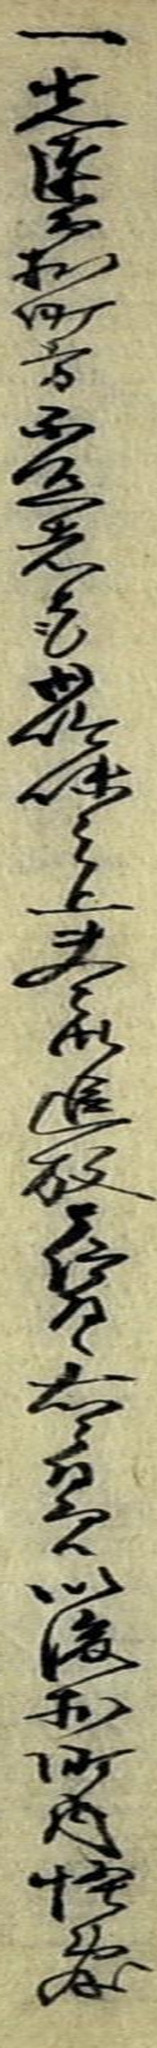一先達而於町方不宜者とも御吟味之上夫々御追放被仰付候右ニ付而ハ以後於町内怪敷
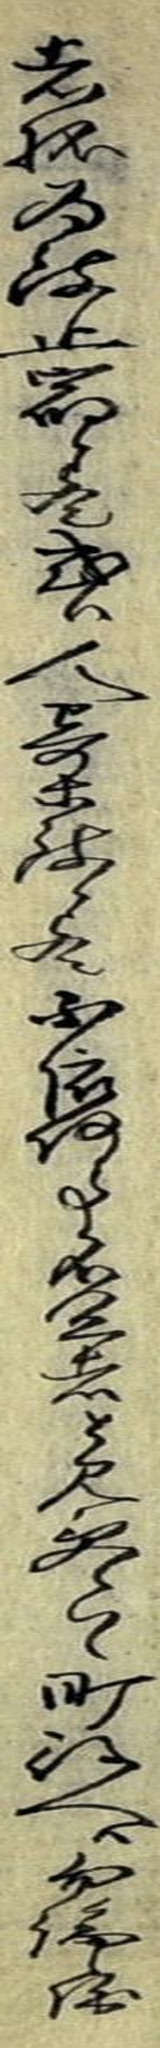者抔為致止宿候歟或ハ人寄等致候歟不依何事不宜者と見受候ハヽ町役人ハ勿論之儀
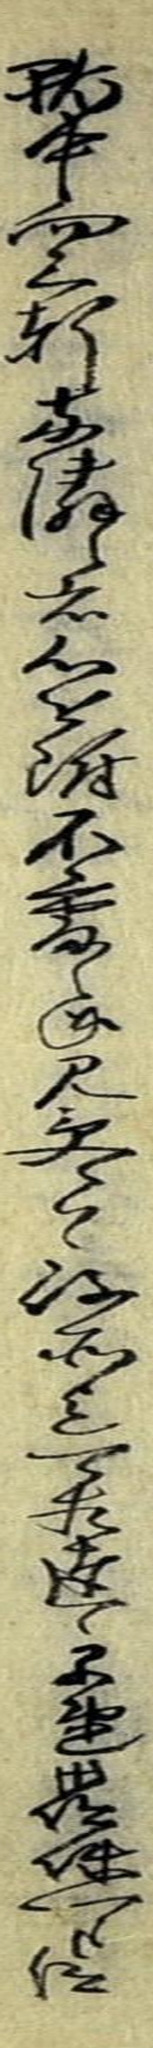就中向三軒両隣之者心を付不審之趣見受候ハヽ役所迄可相達候早速御吟味可被仰
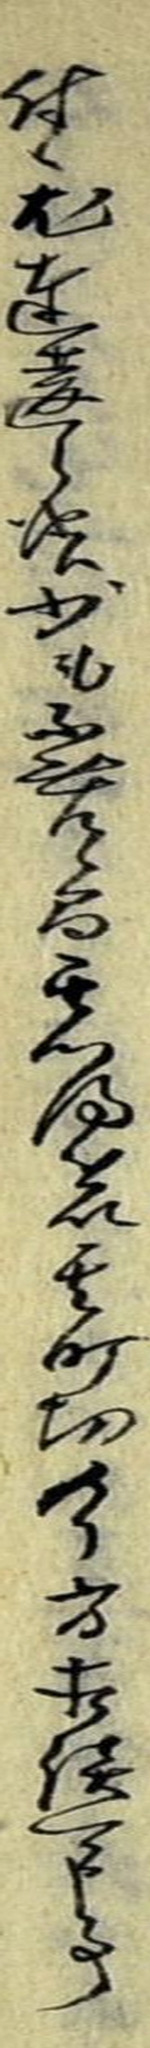付候尤達違之儀ハ少も不苦候間其心得を以其町切〆り方相談可申事
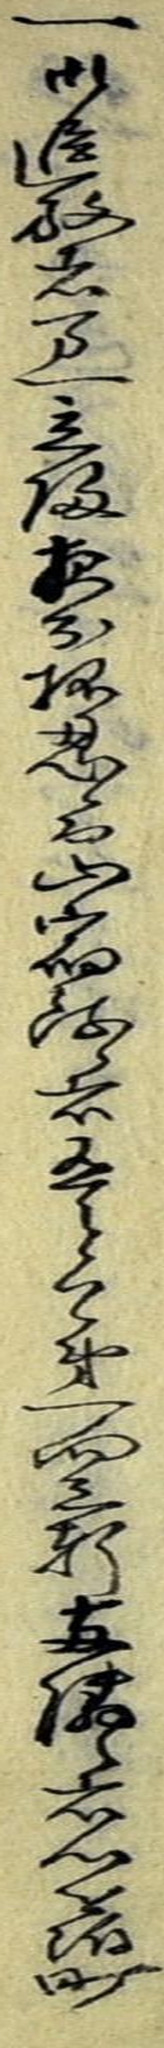一御追放者万一立帰夜分抔忍候而止宿致候者有之候ハヽ第一向三軒両隣之者心を付町

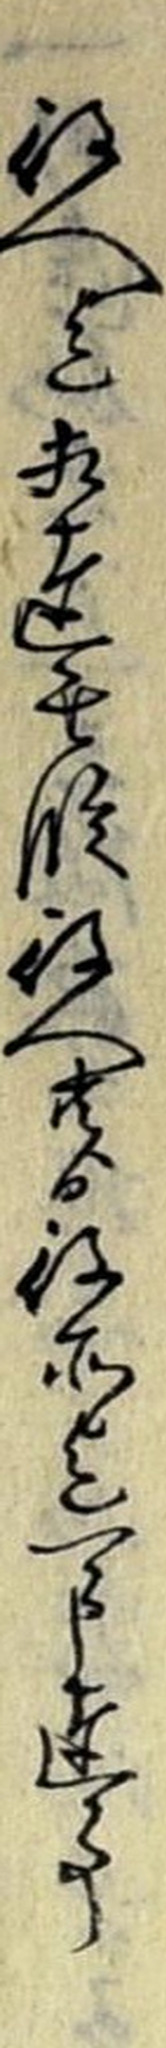役人迄相達其段役人共ゟ役所迄可申達事
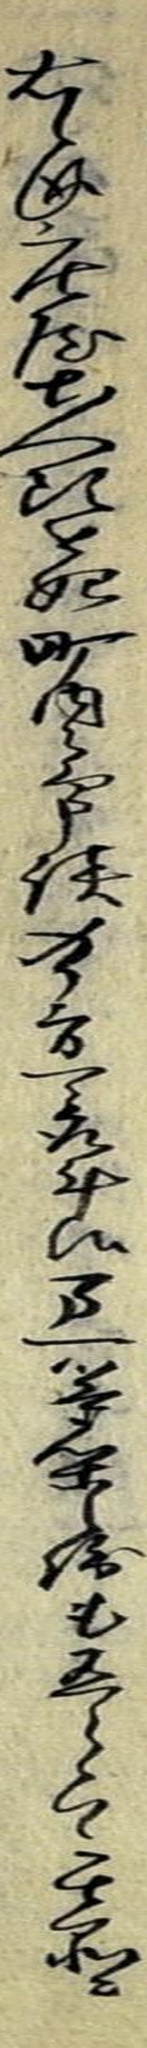右之趣庄屋十人頭を始町内ニ而申談〆り方可取計候万一等閑之儀も有之候ハヽ其品ニ
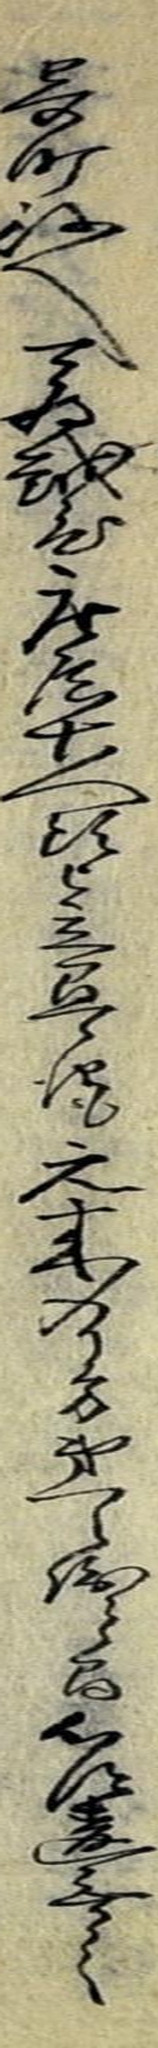寄町役人可為越度庄屋十人頭被立置候儀も元来〆り方第一之儀ニ候間心得違無之
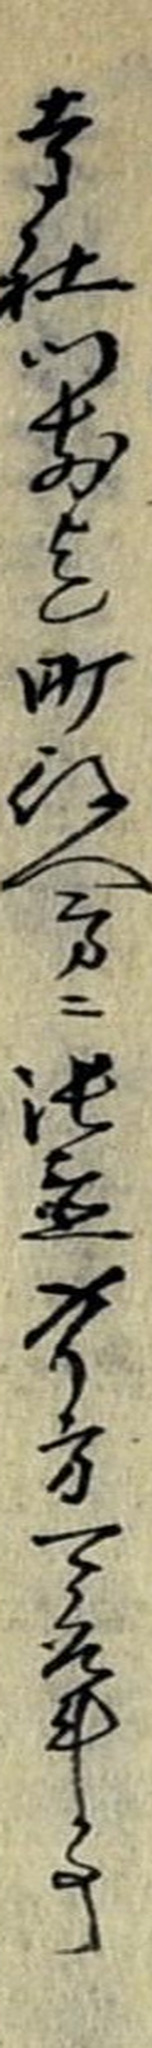寺社門前迄町役人方ニ張置〆り方可取計事
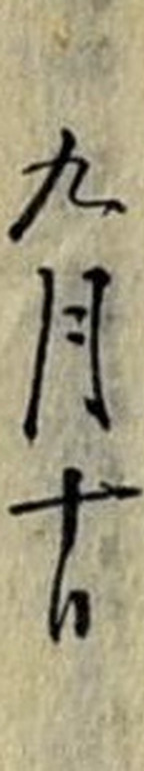九月十日
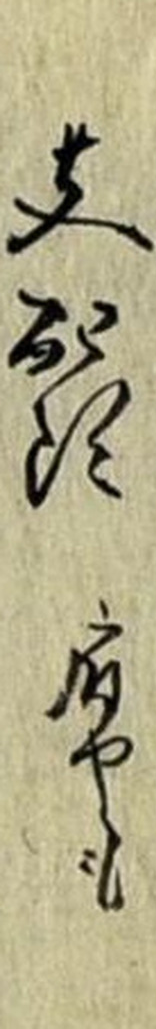支配頭府中へも
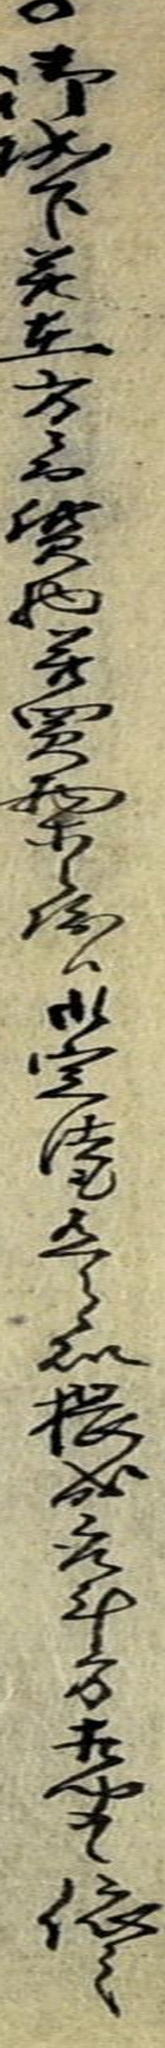〇御城下并在方ニ而質物并買物等之儀ハ御定法も有之候処猥成取計方相聞候依之
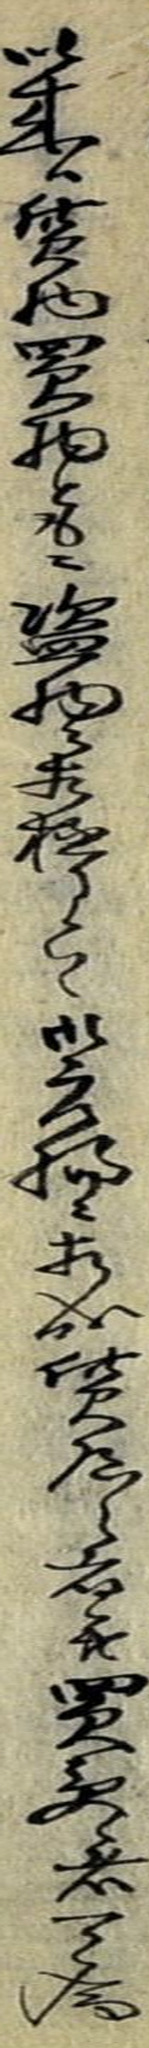以来ハ質物買物ともニ盗物ニ相極り候ハヽ御取揚ニ相成質屋之者并買受候者可為
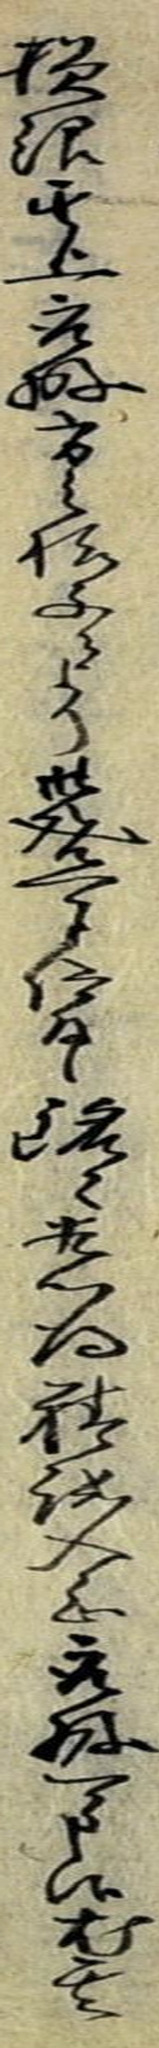損銀其上取扱方之様子ニより御咎可被仰付候銘々相心得精誠入念取扱可申候尤其
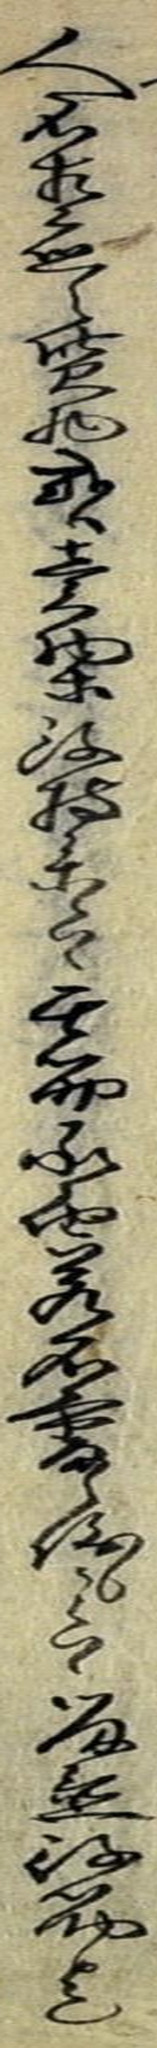人不相応之質物或ハ売物等致持参候ハヽ其筋承届若不審之儀も候ハヽ留置役筋迄
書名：命令之部 三
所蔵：福井県文書館 Fukui Prefectural Archives
